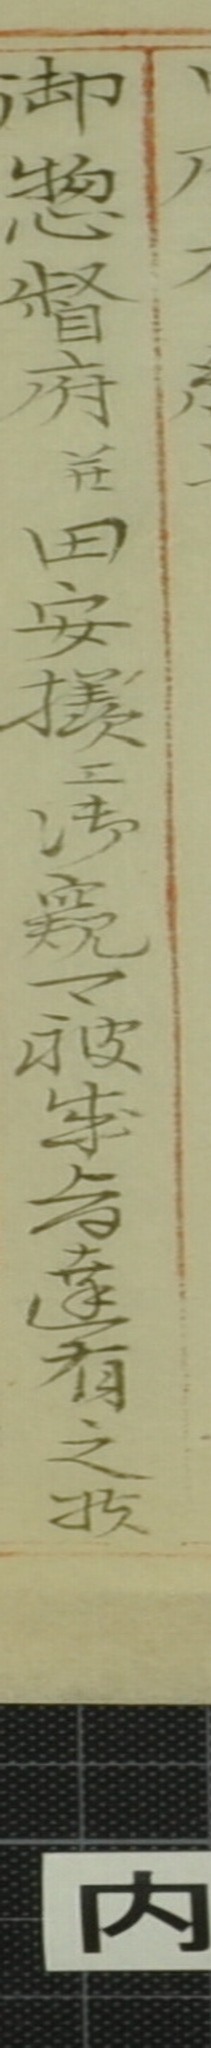御惣督府并田安様エ御窺可被成旨達有之候
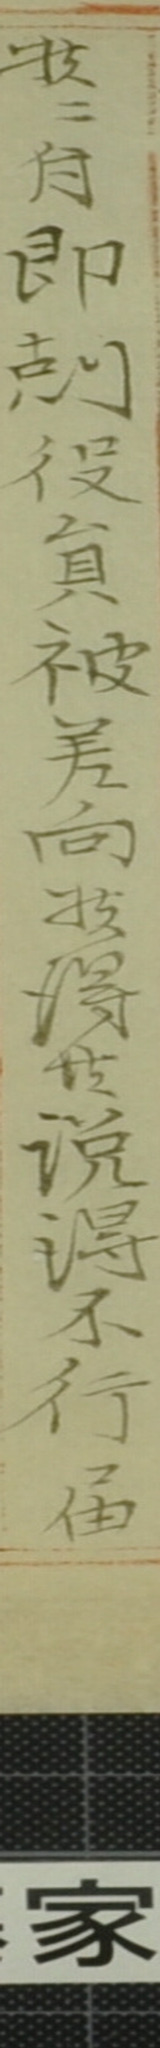候ニ付即刻役員被差向候得共説得不行届
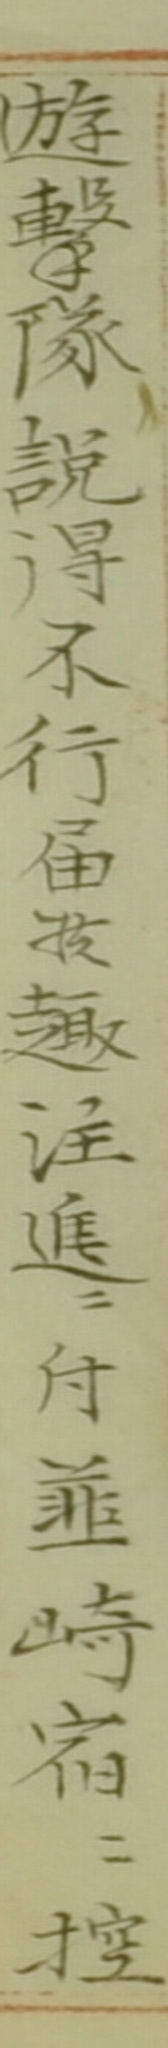遊撃隊説得不行届候趣注進ニ付並崎宿ニ控
